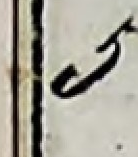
5
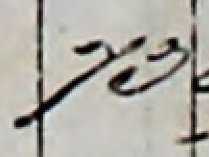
73
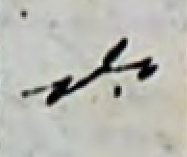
do
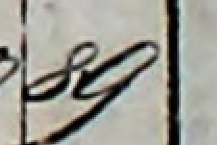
89
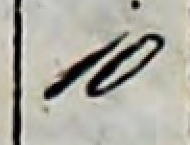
10
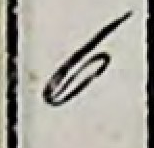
6
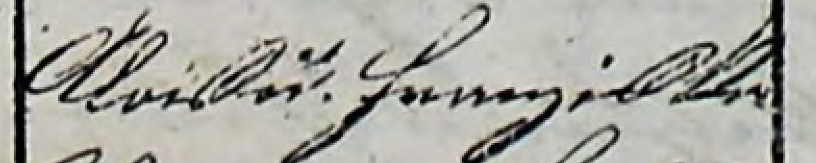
Alois u. Franziska
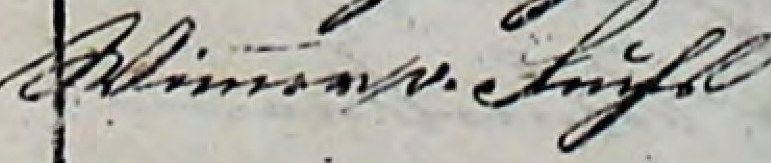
Wimmer v. Fuchs
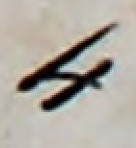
4
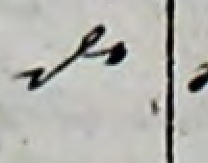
do
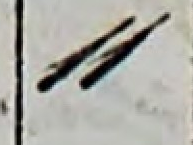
11
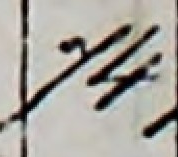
74
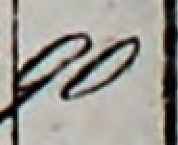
90
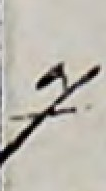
7
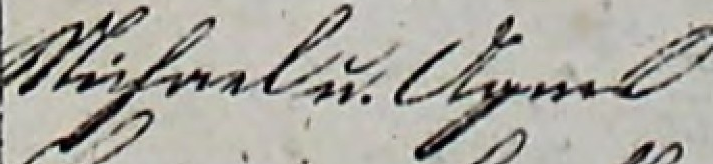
Michael u. Agnes
